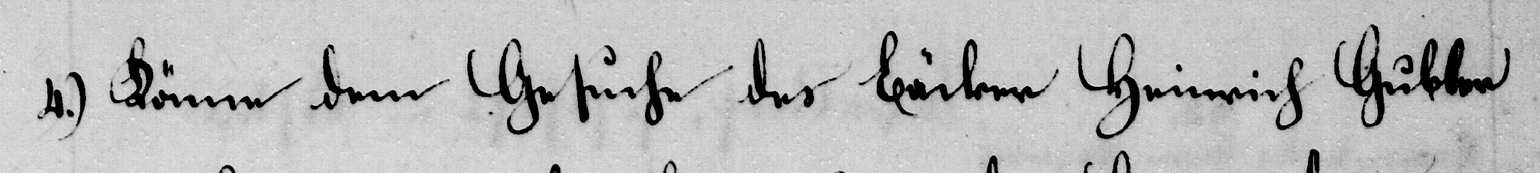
4.) Könne dem Gesuch des Bäcker Heinrich Gubler
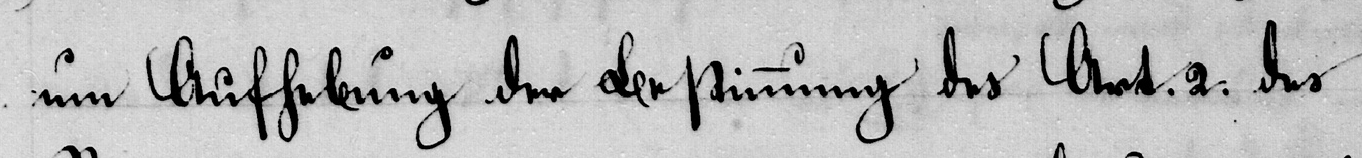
um Aufhebung der Bestimmung des Art. 2. des
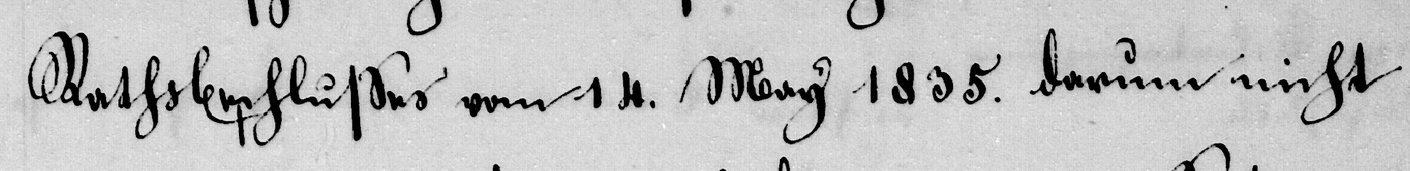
Rathsbeschlußes vom 14. May 1935. darum nicht
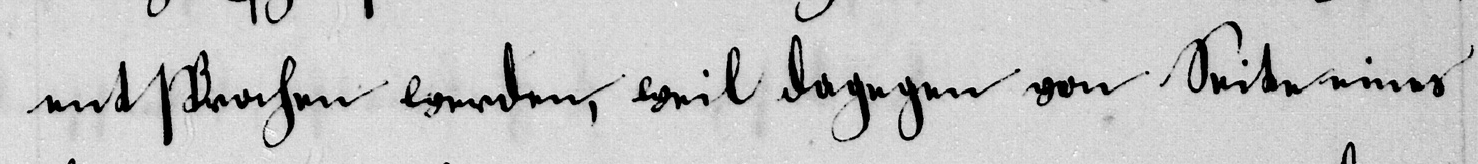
entsprochen werden, weil dagegen von Seite eines
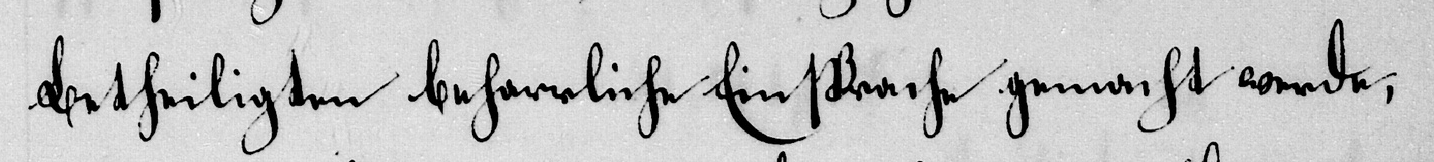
Betheiligten beharrliche Einsprache gemacht werde,
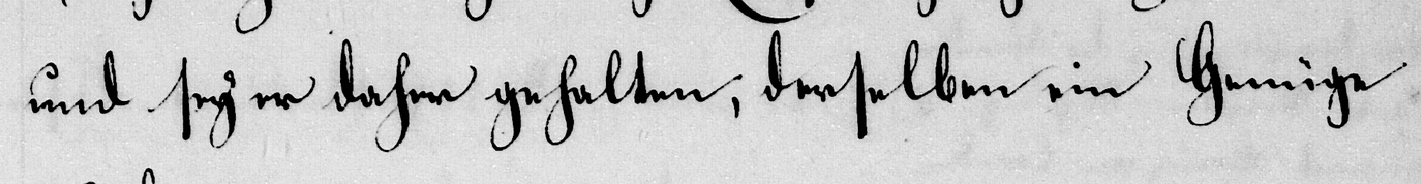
und sey er daher gehalten, derselben in Genüge
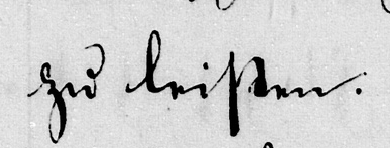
zu leisten.
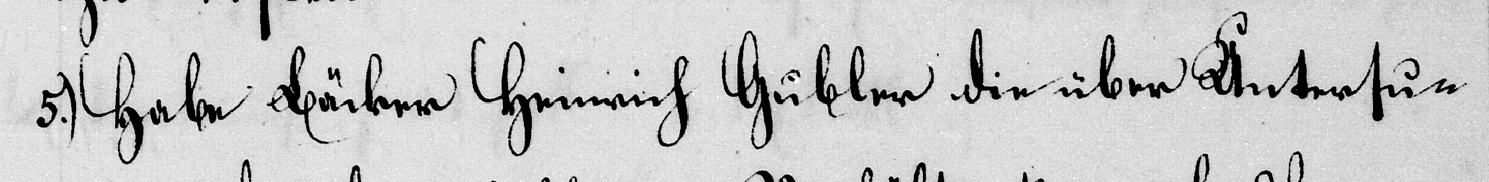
5.) Habe Bäcker Heinrich Gubler die über Untersu¬
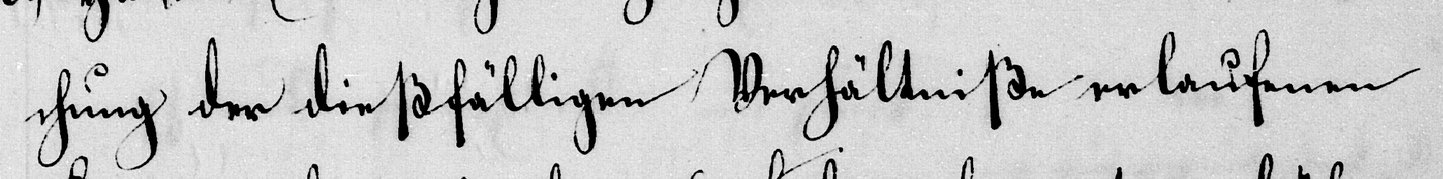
chung der dießfälligen Verhältniße erlaufenen
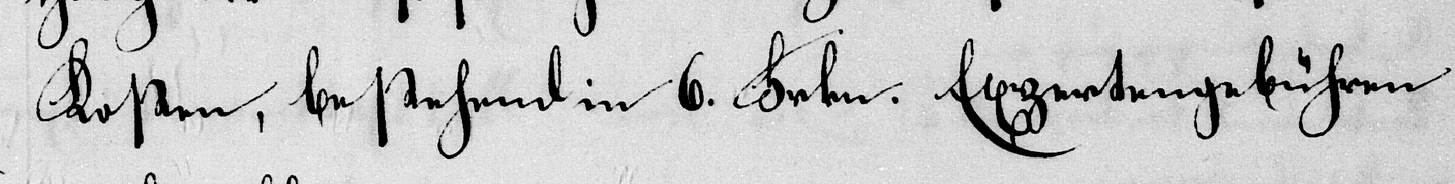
Kosten, bestehend in 6. Frk[en] Expertengebühren
